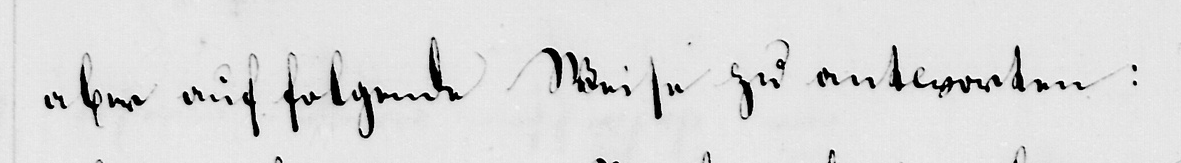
aber auf folgende Weise zu antworten:
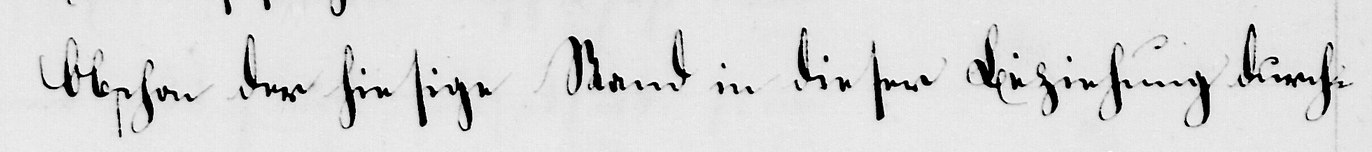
Obschon der hiesige Stand in dieser Beziehung durch¬
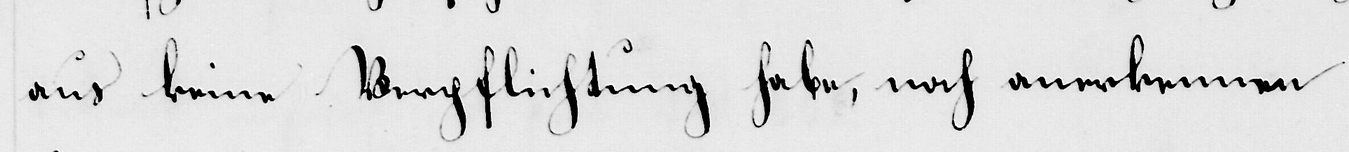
aus keine Verpflichtung habe, noch anerkennen
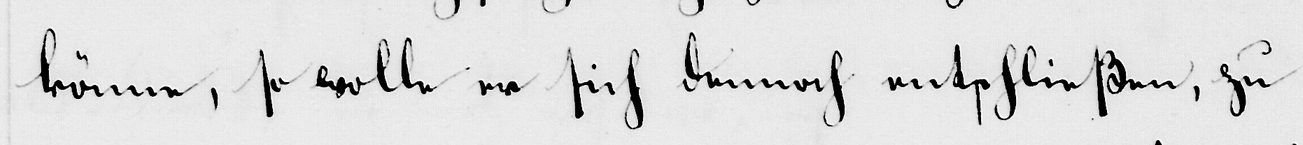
könne, so wolle er sich dennoch entschließen, zu
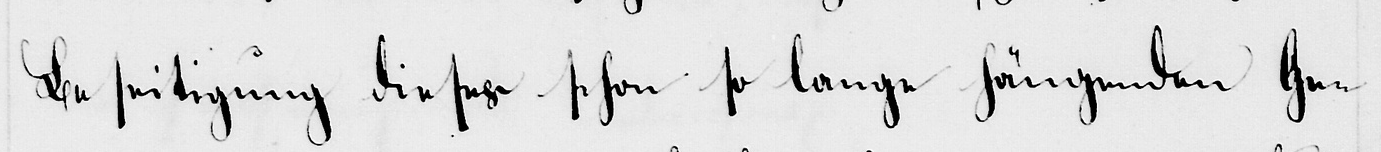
Beseitigung dieses schon so lange hängenden Ge¬
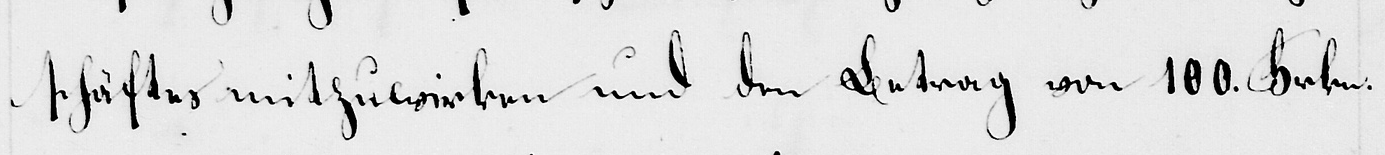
schäftes mitzuwirken und den Betrag von 100. Frkn.
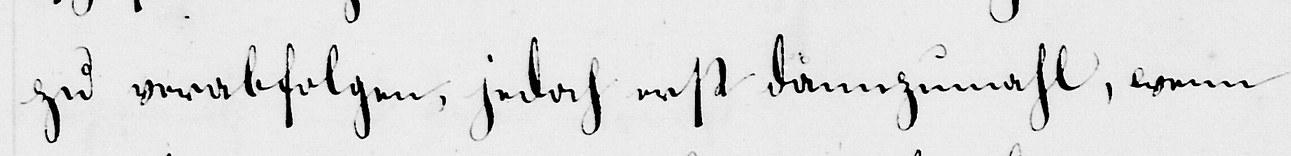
zu verabfolgen, jedoch erst dannzumahl, wenn
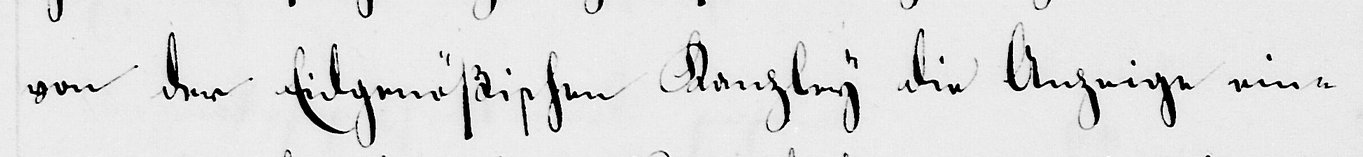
von der Eidgenößischen Kanzley die Anzeige ein¬
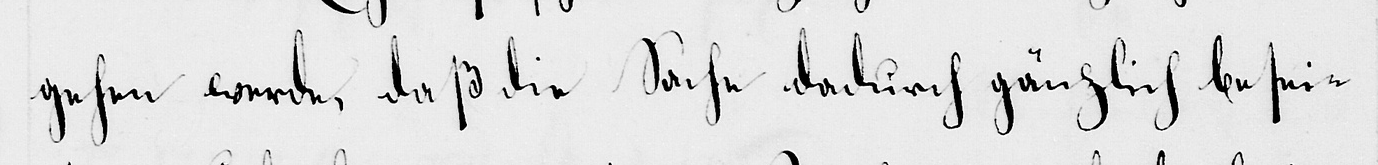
gehen werde, daß die Sache dadurch gänzlich besei¬
